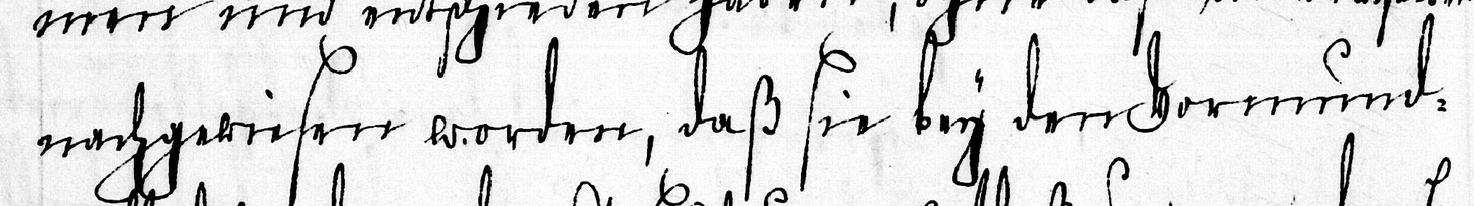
nachgewiesen worden, daß sie bey den Vormund¬
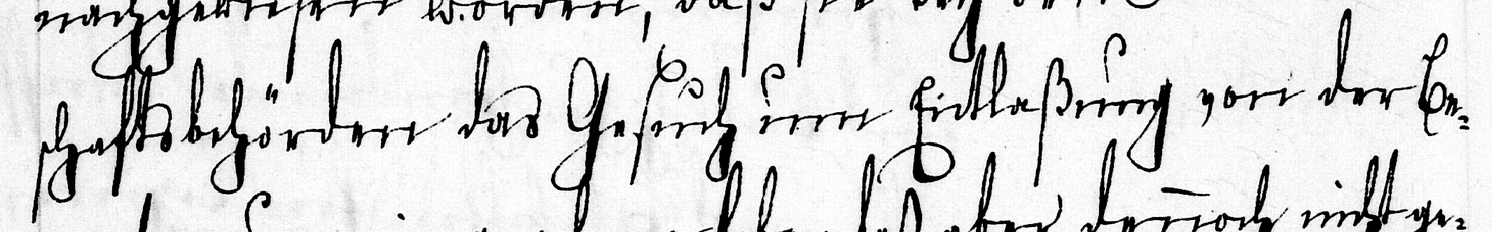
schaftsbehörden das Gesuch um Entlaßung von der Be¬
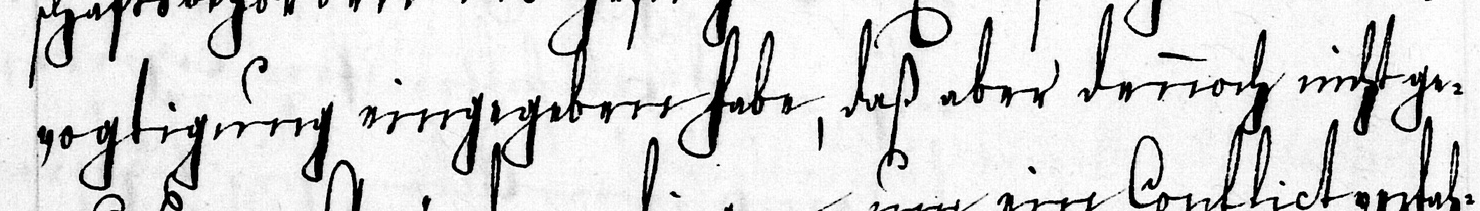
vogtigung eingegeben habe, daß aber dennoch nicht ge¬
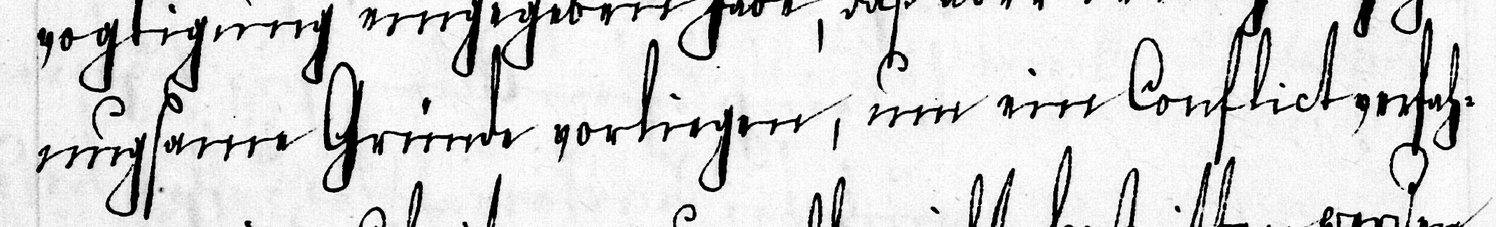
nugsame Gründe vorliegen, um ein Conflictverfah¬
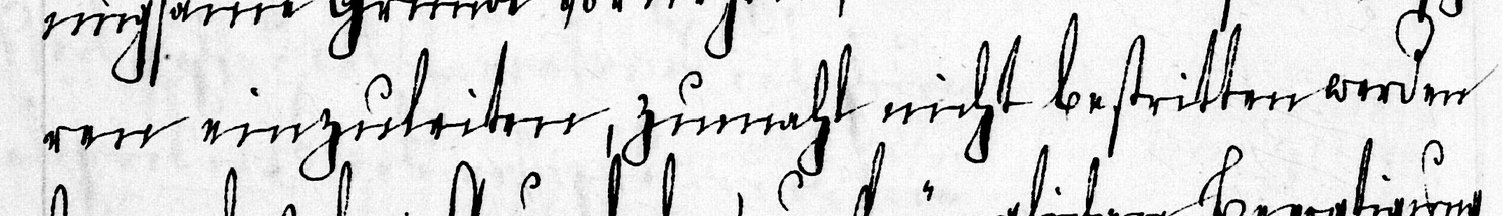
ren einzuleiten, zumahl nicht bestritten werden
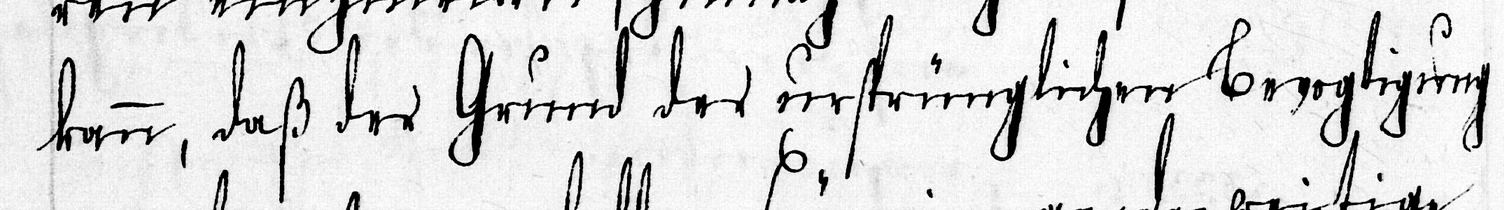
kann, daß der Grund der ursprünglichen Bevogtigung
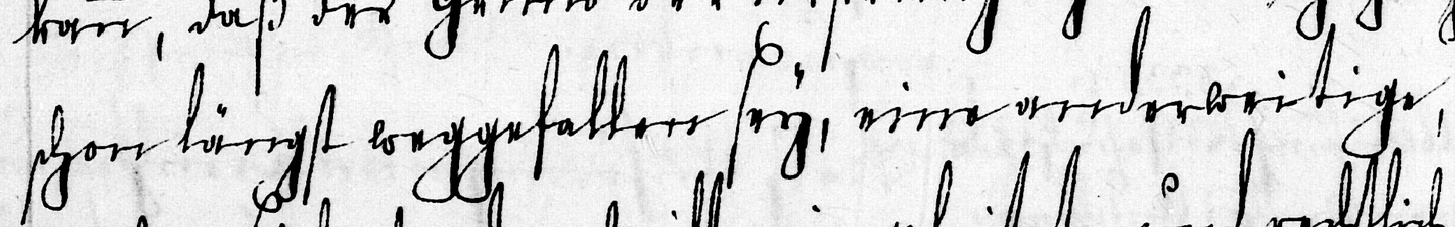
schon längst weggefallen sey, eine anderweitige,
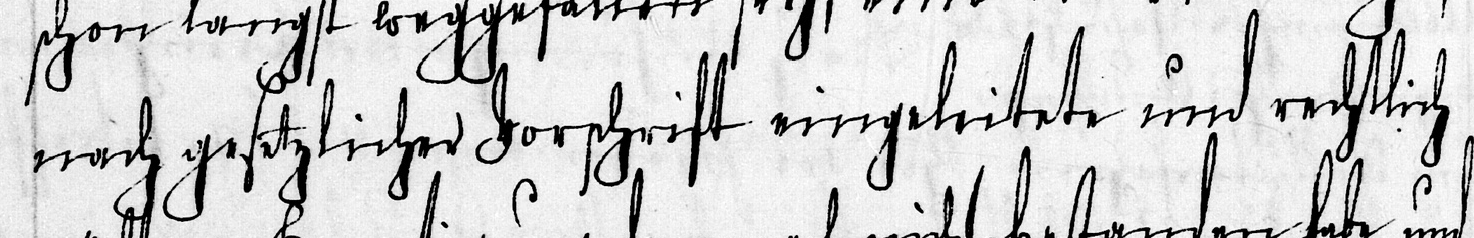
nach gesetzlicher Vorschrift eingeleitete und rechtlich
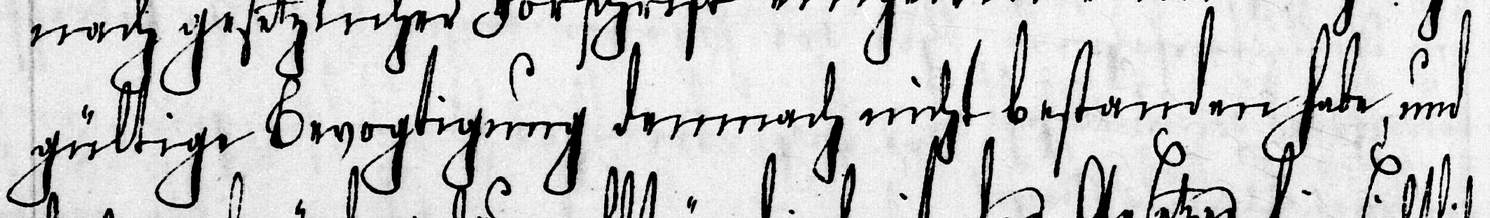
gültige Bevogtigung demnach nicht bestanden habe, und
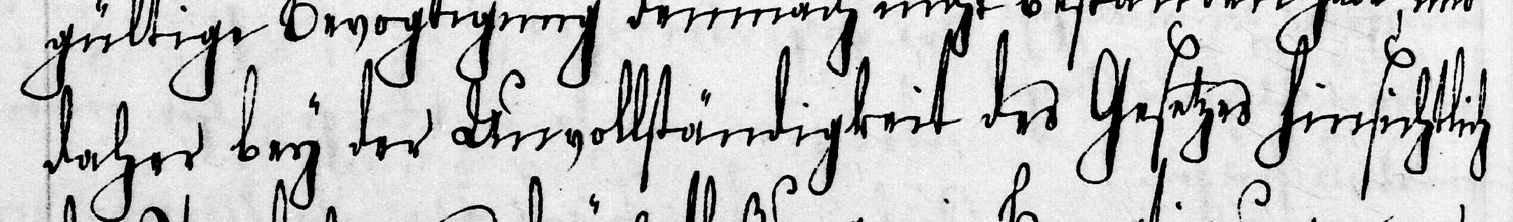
daher bey der Unvollständigkeit des Gesetzes hinsichtl¬
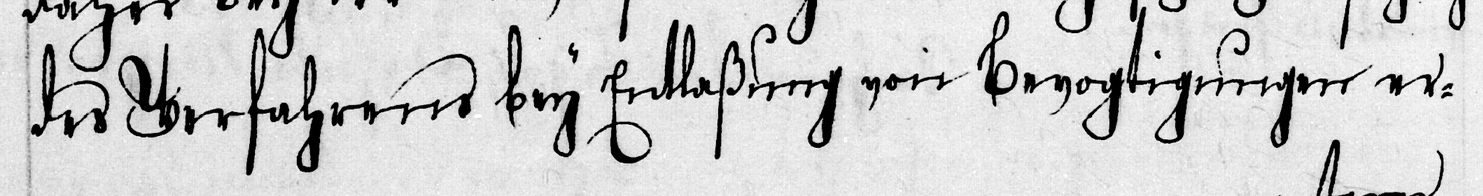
des Verfahrens bey Entlaßung von Bevogtigungen er-
